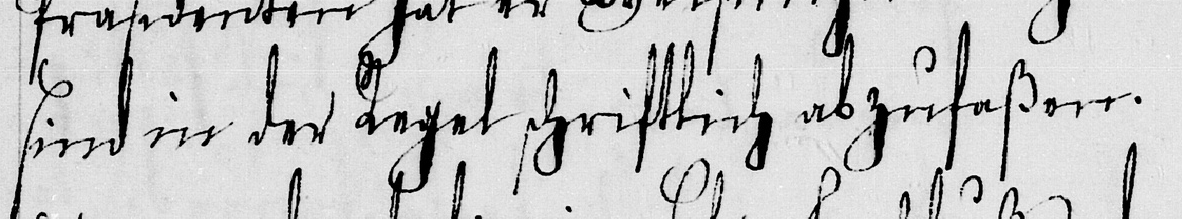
sind in der Regel schriftlich abzufaßen.
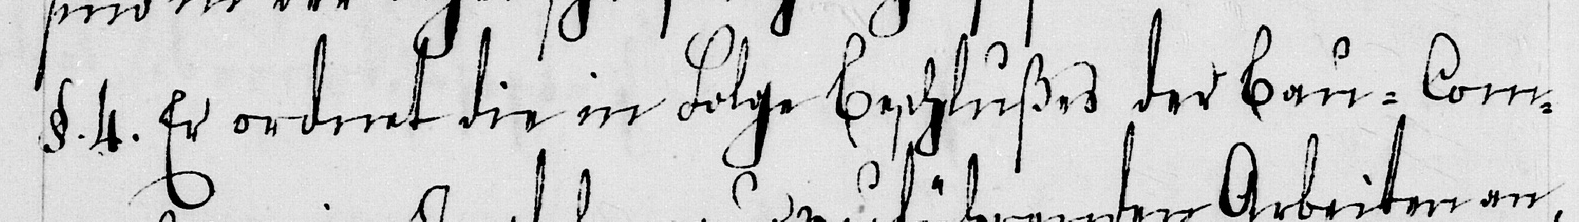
§. 4. Er ordnet die in Folge Beschlußes der Bau-Com¬
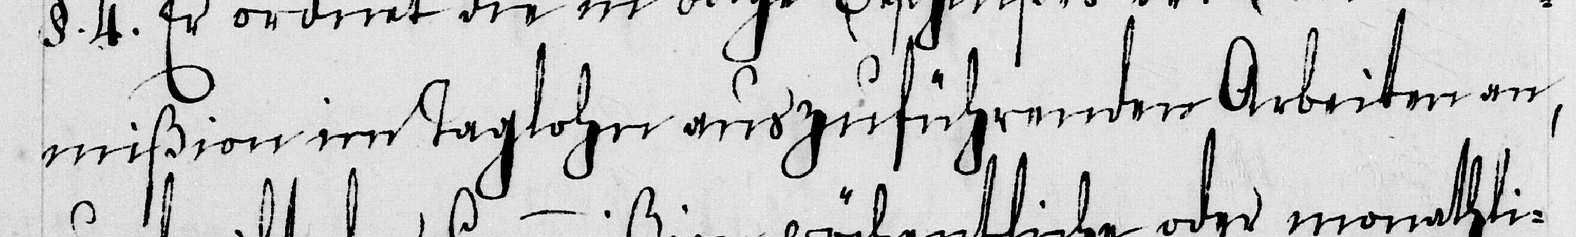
mißion im Taglohn auszuführenden Arbeiten an,
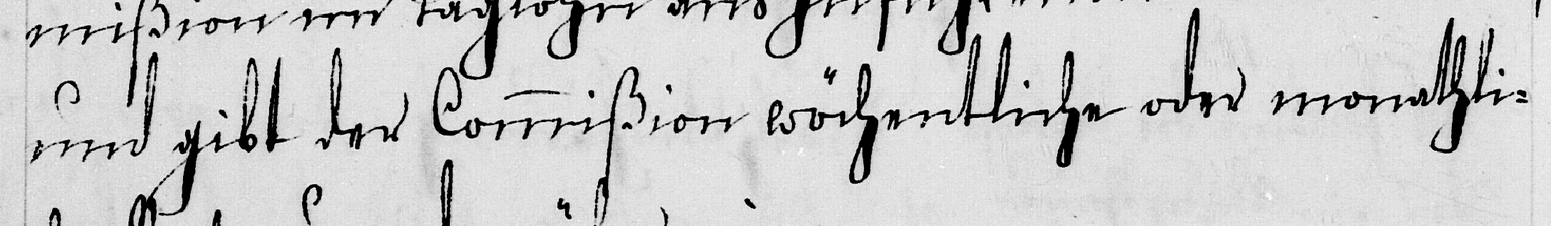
und gibt der Commißion wöchentliche oder monathli¬
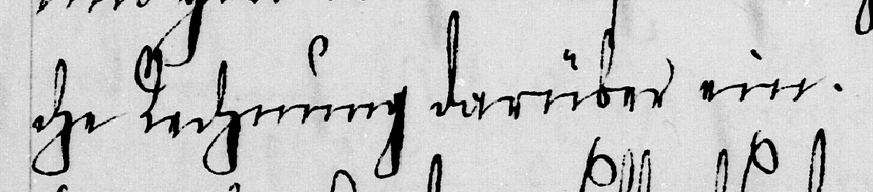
che Rechnung darüber ein.
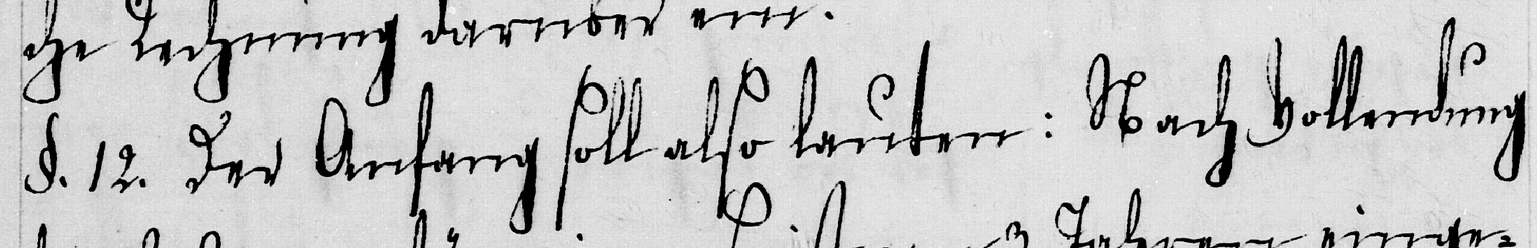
§. 12. Der Anfang soll also lauten: Nach Vollendung
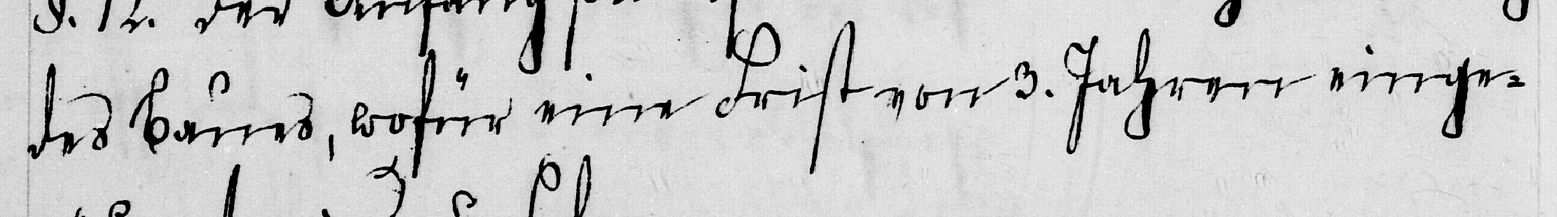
des Baues, wofür eine Frist von 3. Jahren einge¬
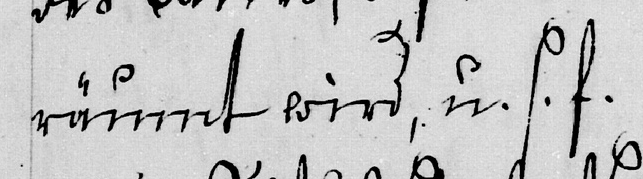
räumt wird, u. s. f.
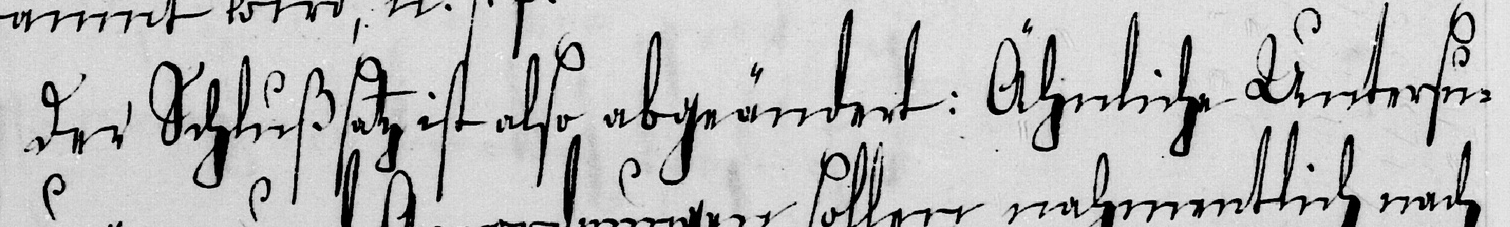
Der Schlußsatz ist also abgeändert: Ähnliche Untersu¬
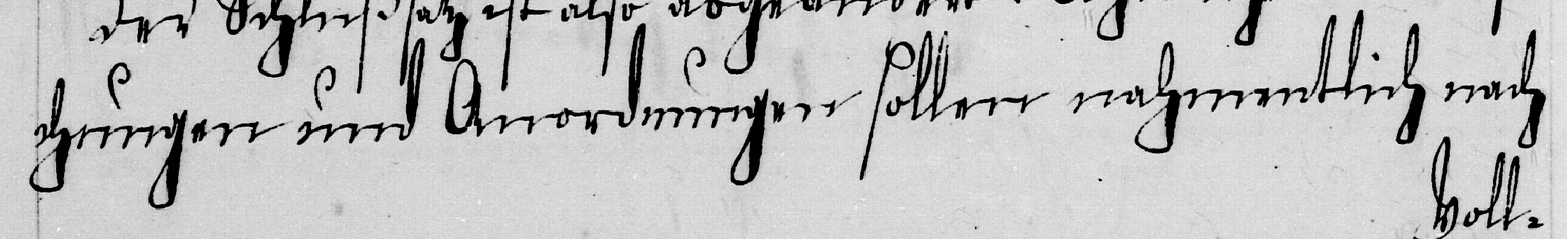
chungen und Anordnungen sollen nahmentlich nach
